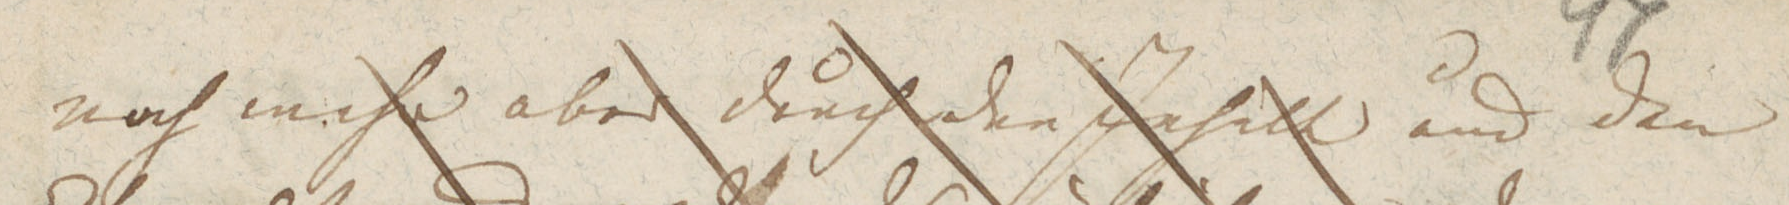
noch mehr aber durch den Inhalt und den
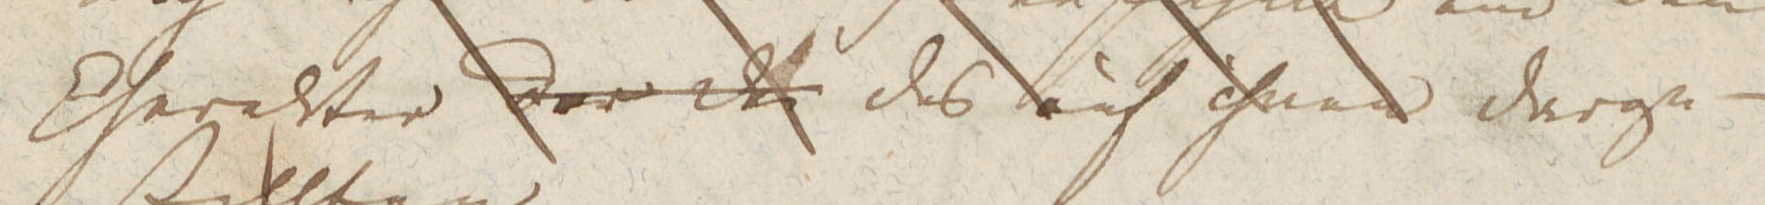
Charakter der da des auf ihnen Darge-
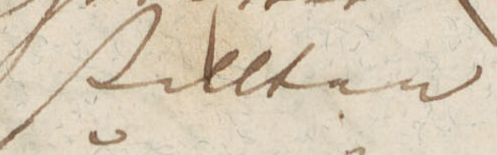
stellten
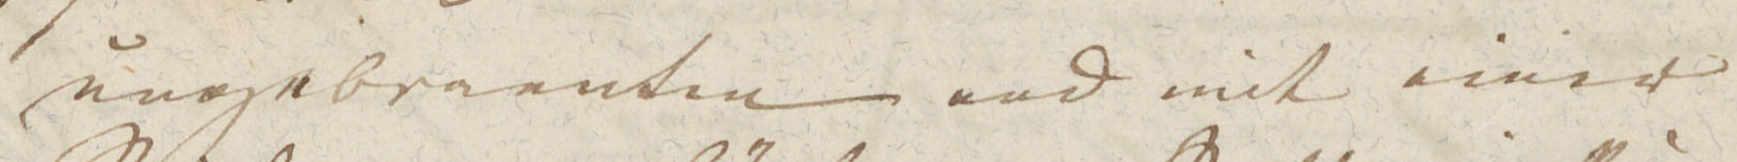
ungebrannten und mit einer
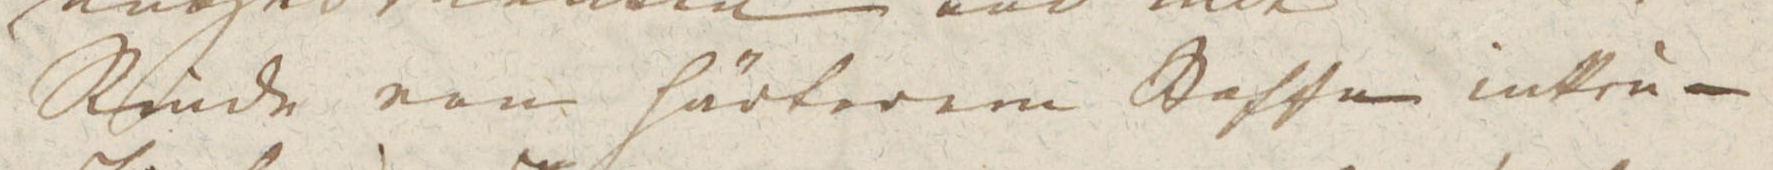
Rinde von härterem Stoffe inkru-
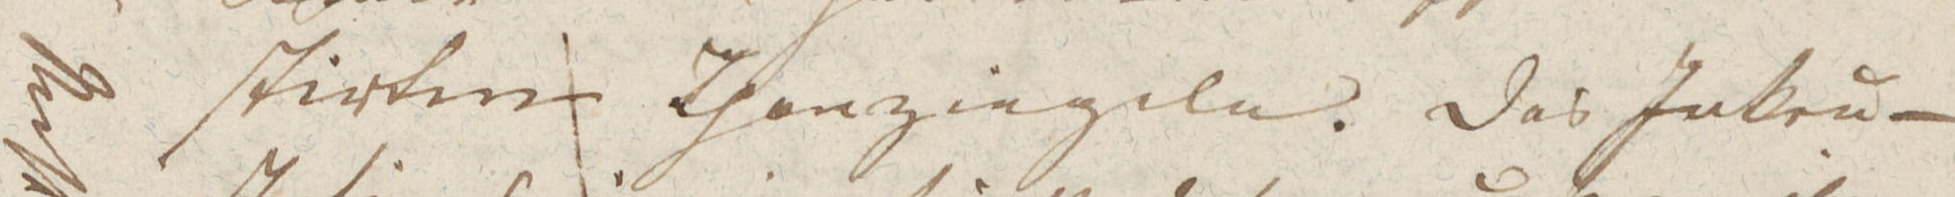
stirten Thonziegeln. Das Inkru-
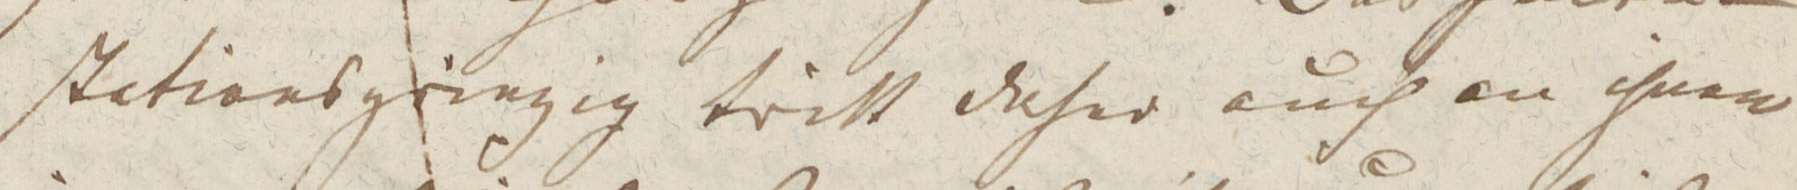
stationsprinzip tritt daher auch an ihnen
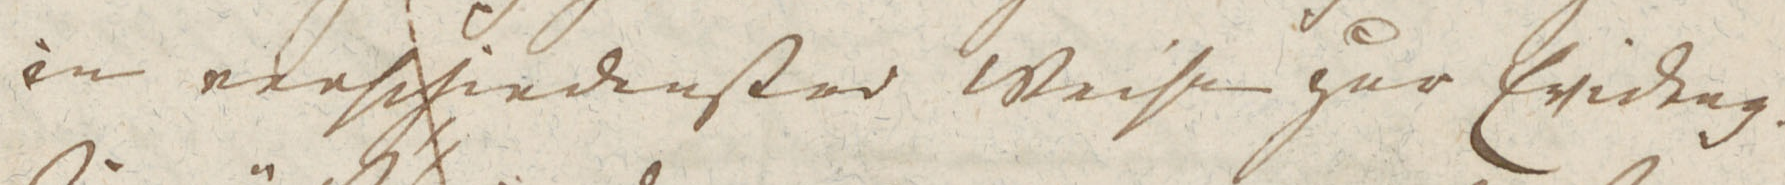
in verschiedenster Weise zur Evidenz.
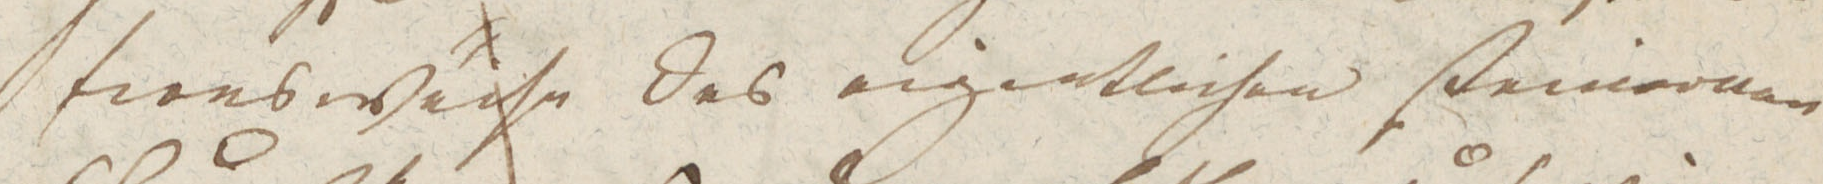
tionsweise des eigentlichen steinernen
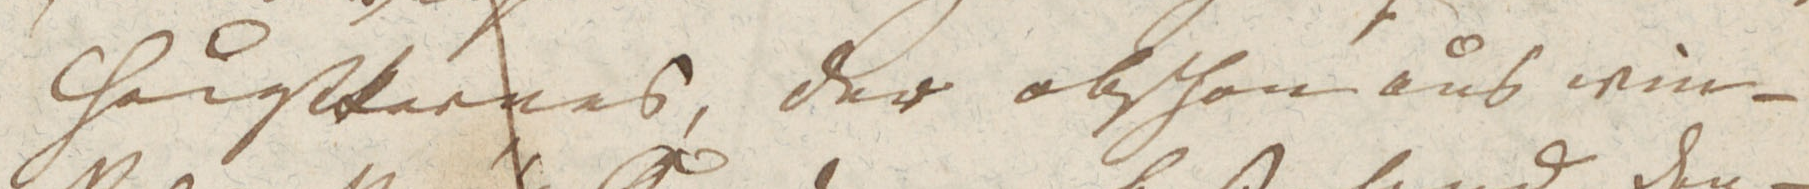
Hauptkernes, der obschon aus win-
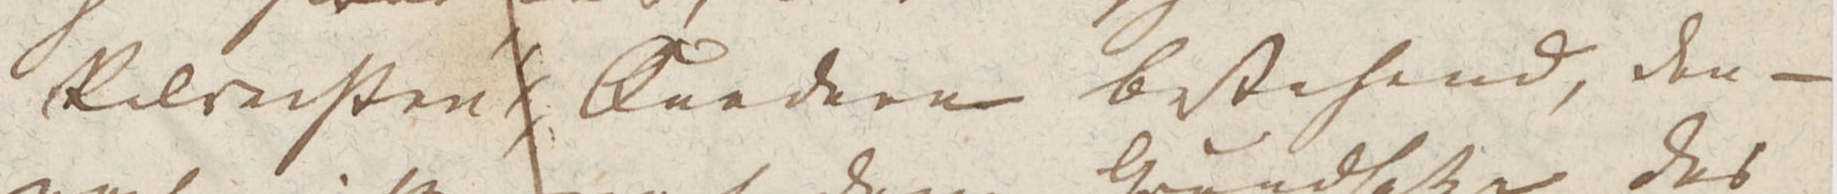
kelrechten Quadern bestehend, den-
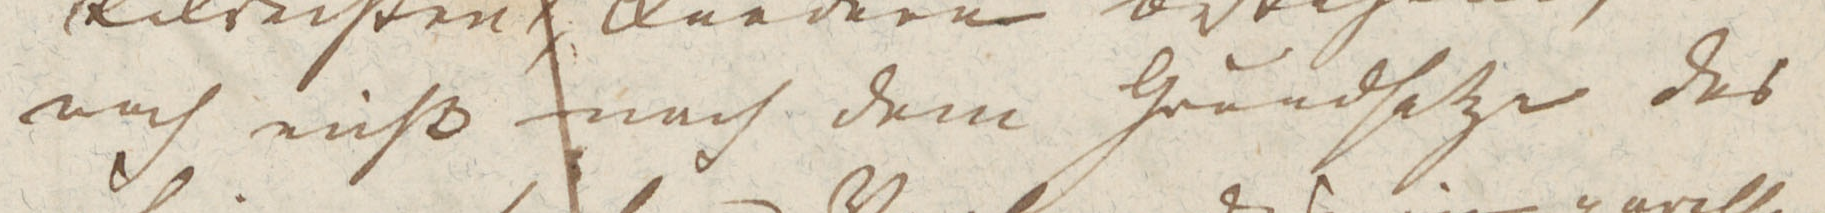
noch nicht nach dem Grundsatze des
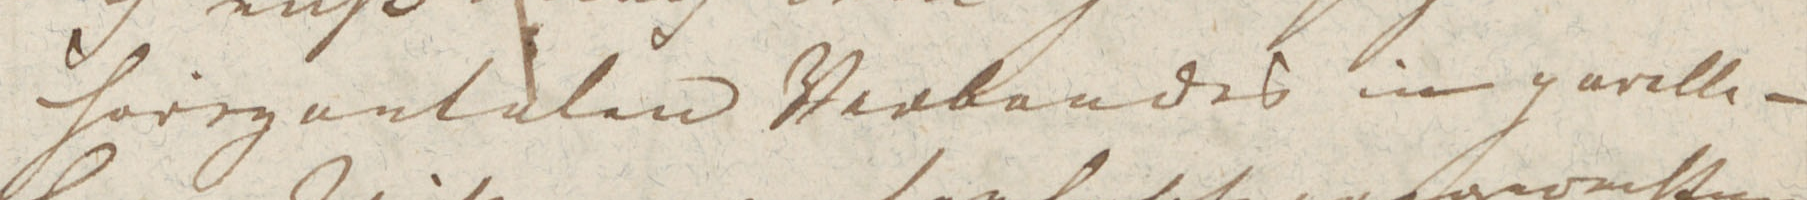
horizontalen Verbandes in paralle-
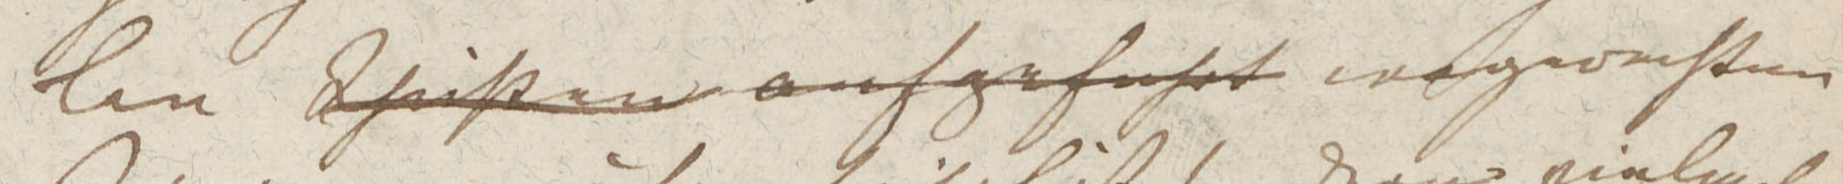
len Schichten aufgefuhrt wagerechten
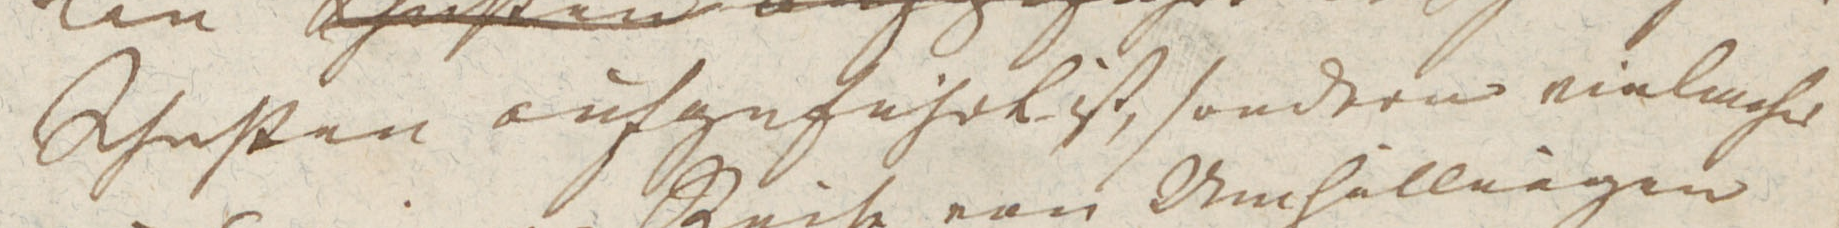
Schichten aufgeführt ist, sondern vielmehr
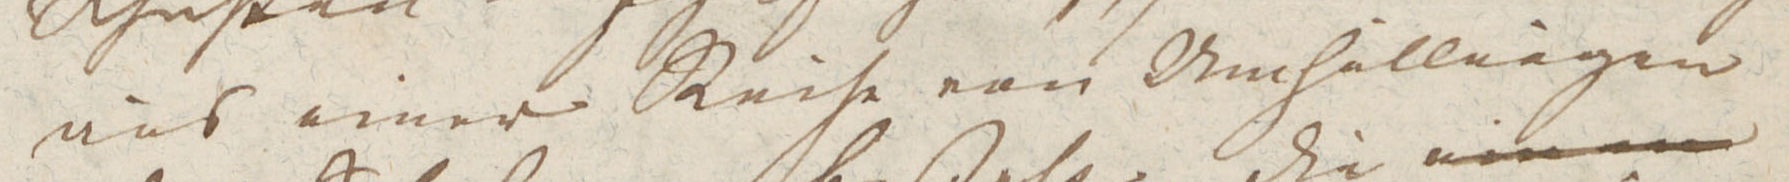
aus einer Reihe von Umhüllungen
